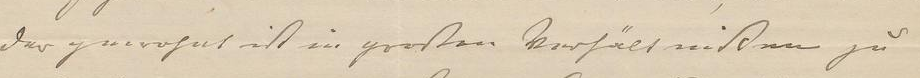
der gewohnt ist in großen Verhältnißen zu
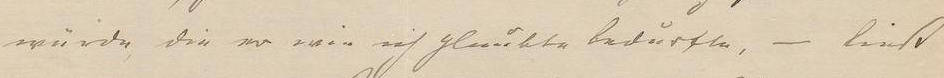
würde, die er wie ich glaubte bedürfte, – ließ
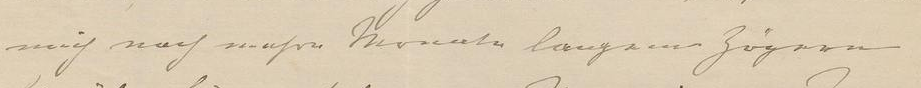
mich nach mehre Monate langem Zögern
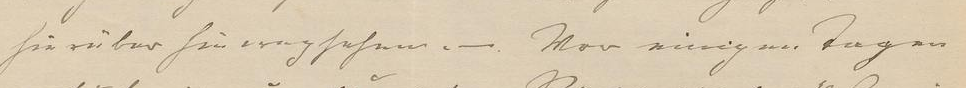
hierüber hinwegsehen. – Vor einigen Tagen
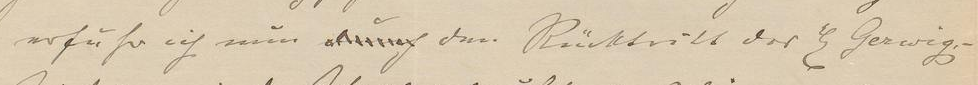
erfuhr ich nun durch den Rücktritt des H Gerwig. –
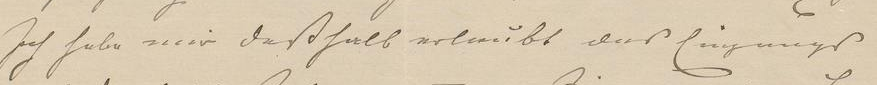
Ich habe mir deßhalb erlaubt das Eingangs
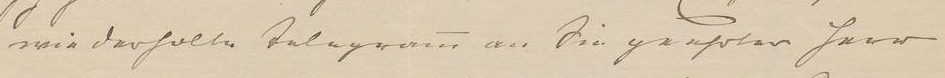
wiederholte Telegramm am Sie geehrter Herr
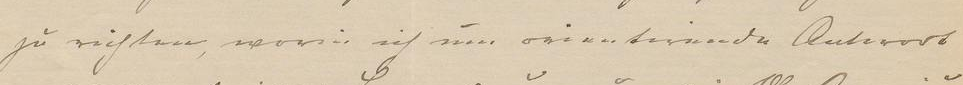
zu richten, worin ich um orientirende Antwort
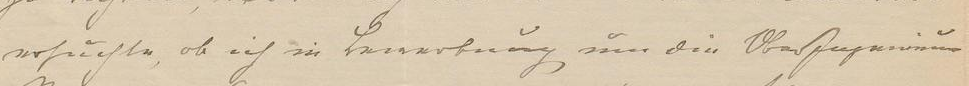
ersuchte, ob ich in Bewerbung um die Oberingenieur
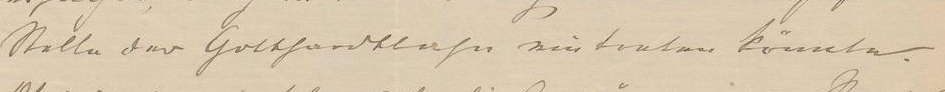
Stelle der Gotthardtbahn eintreten könnte.
